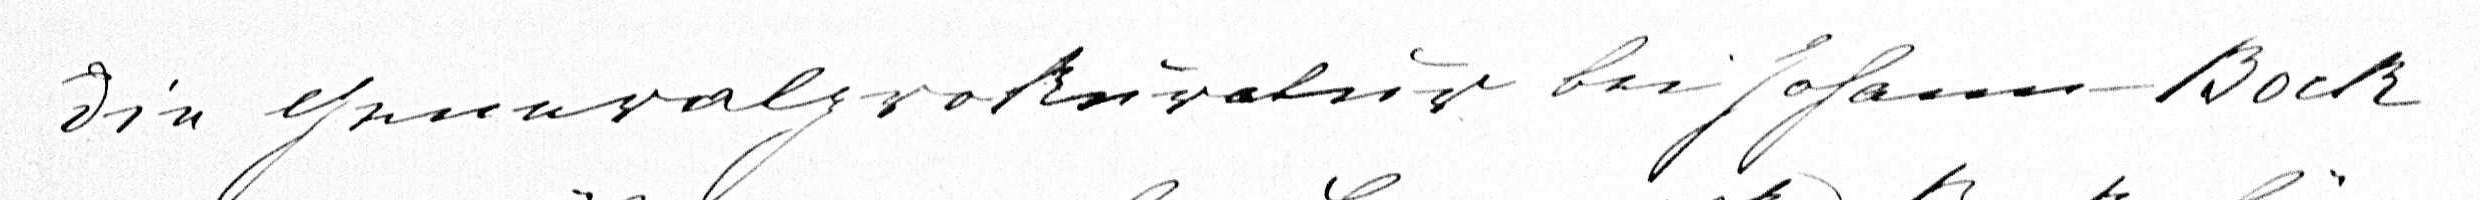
Die Genaralzrokuratur bei Johann Bock
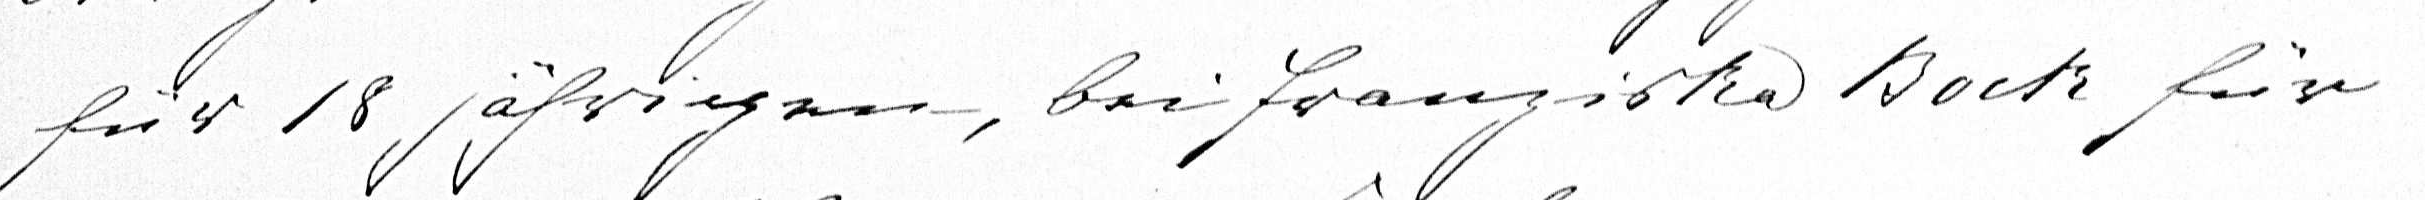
für 18 jährigen , bei Franziska Bock für
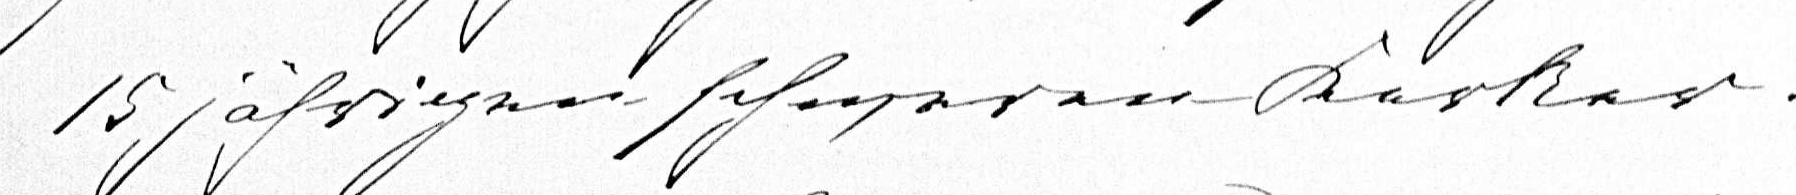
15 jährigen schweren Kerker.
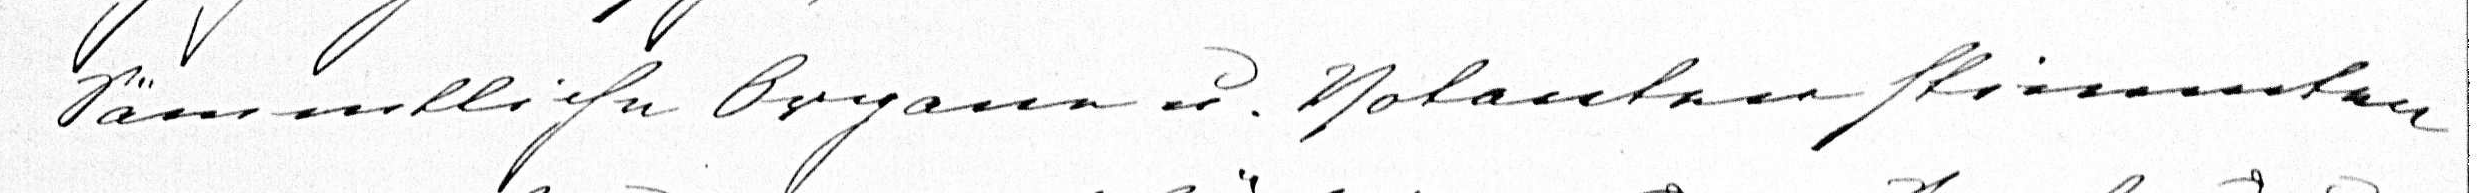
Sämmtliche Organe u. Volanten stimmten
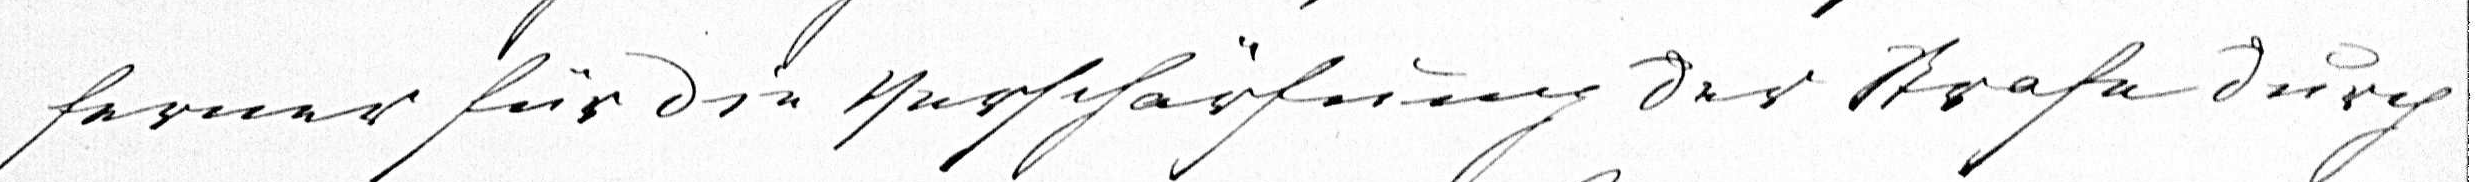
ferner für die Verschärfung der Strafe durch
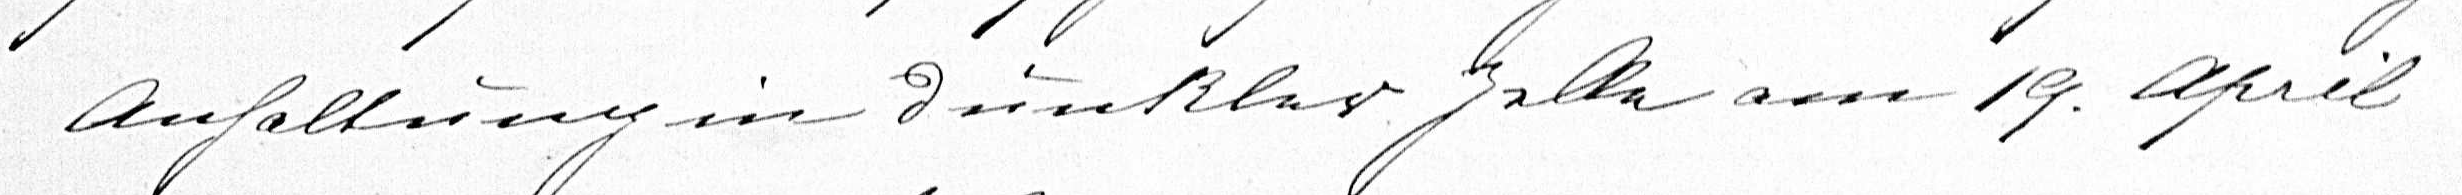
Anhaltung in dunkler Zelle am 19. April
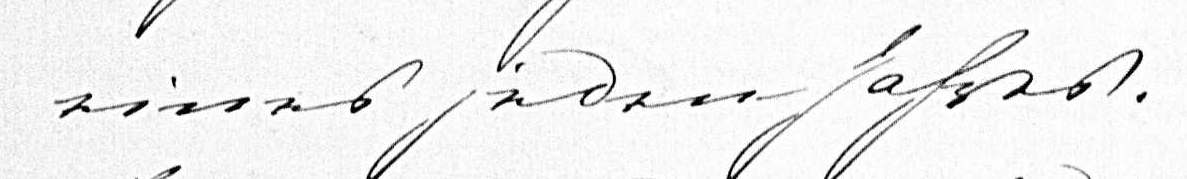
eines jeden Jahres.
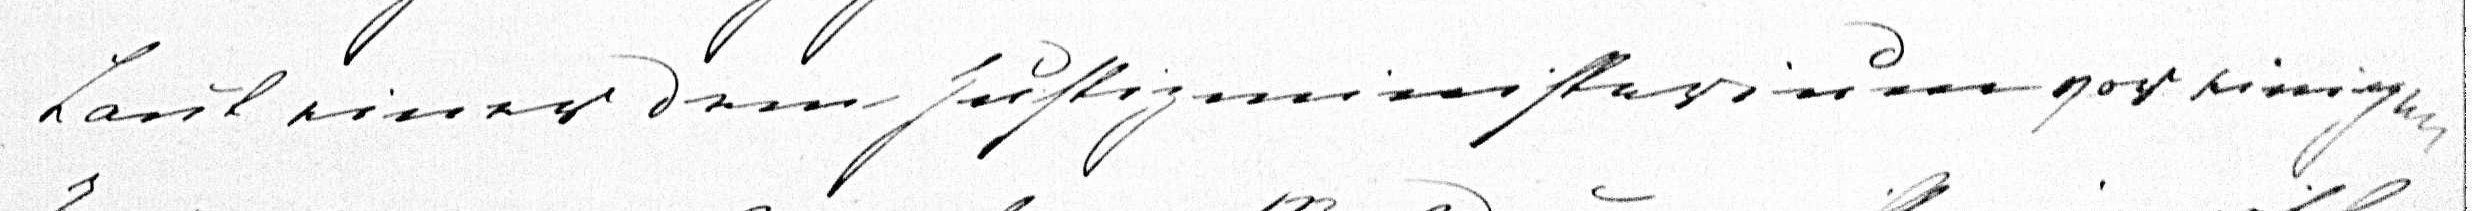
Laut einer dem Justizministerium vor einigen
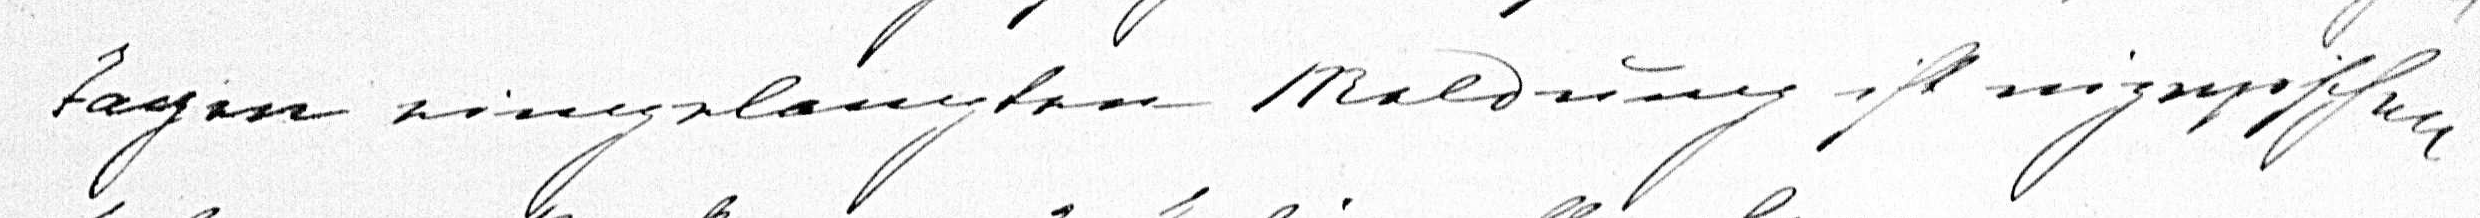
Tagen eingelangten Meldung ist eizwischen
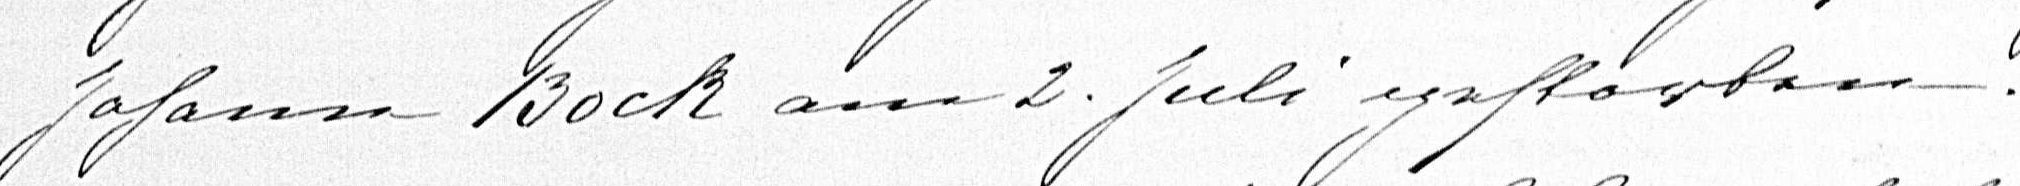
Johann Bock am 2. Juli gestorben.
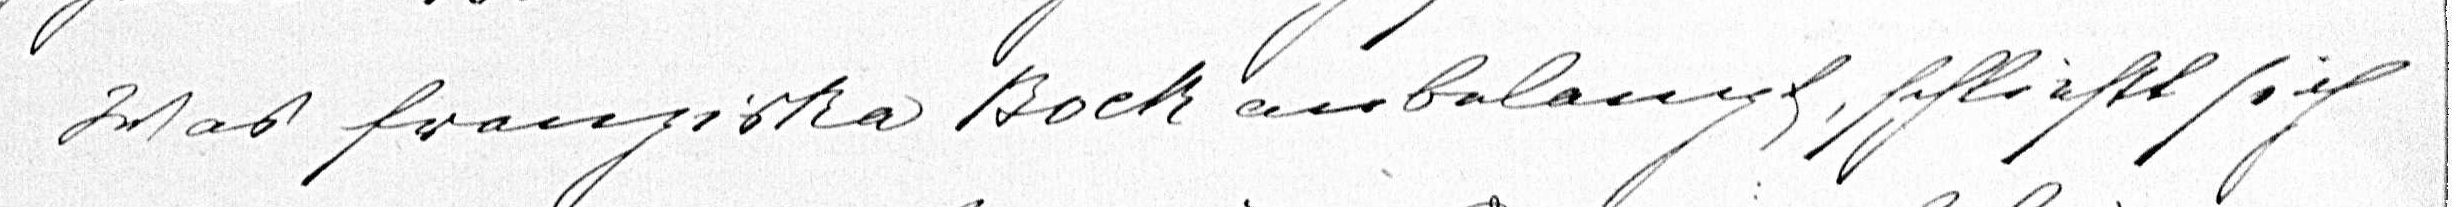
Was Franziska Bock anbelangt, schliefst sich
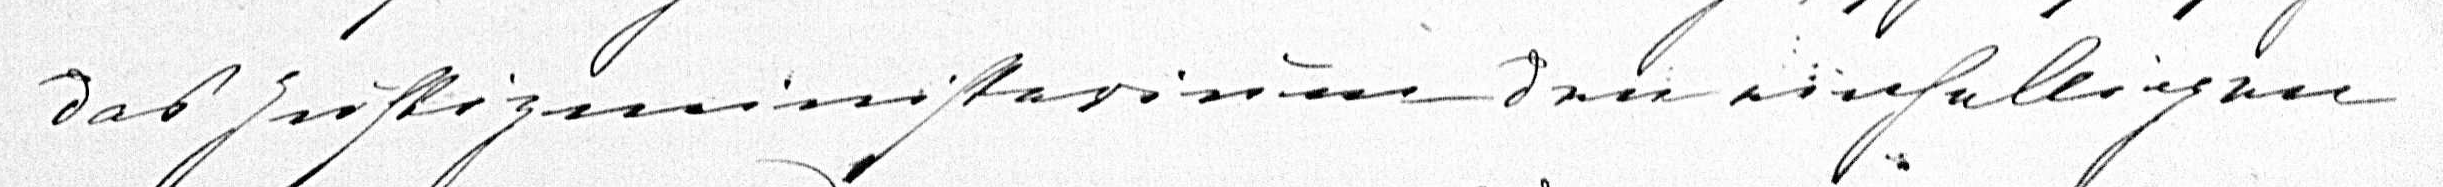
das Justizministerium den einhelligen
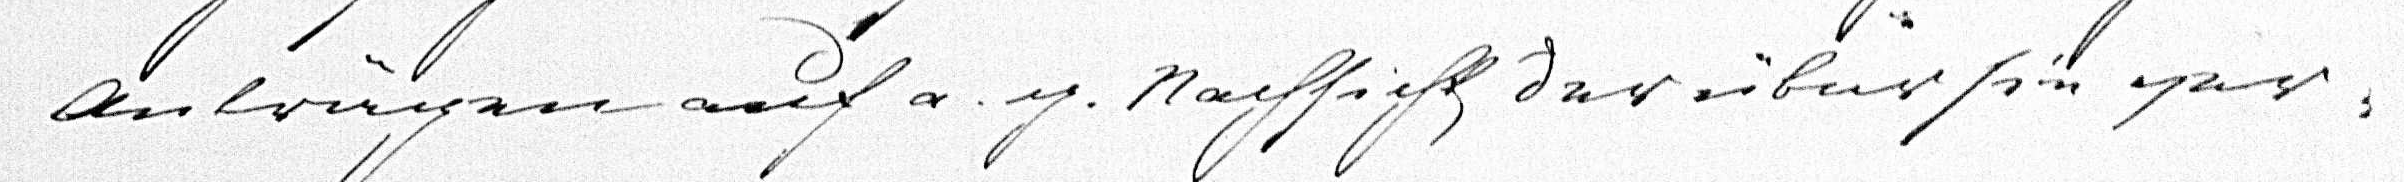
Anträgen auf a. g. Nachsicht der über sie ver¬
